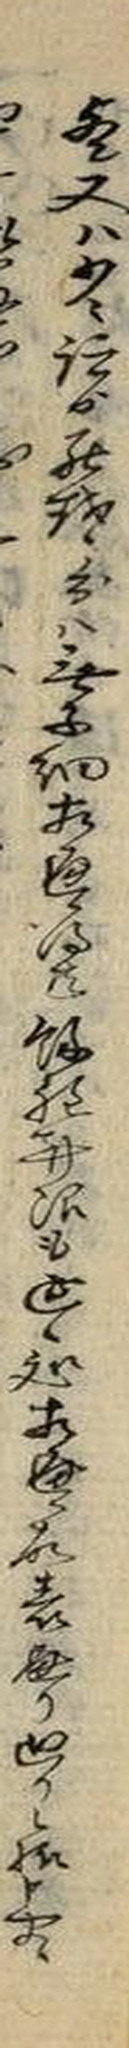歟又は少々跡ゟ罷越候分は無子細相通候得共餘程刻限も延候処相通候故表通り廻り候様申聞候
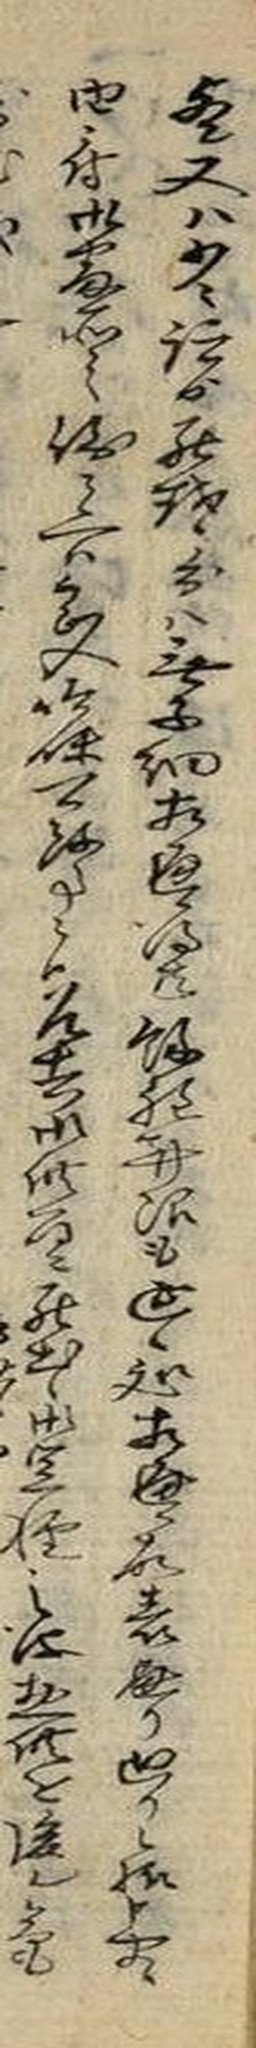由に付御番所之儀に候へは念入吟味可致事に候乍去御供筒に罷出候御足軽之儀惣共と後レ候而も
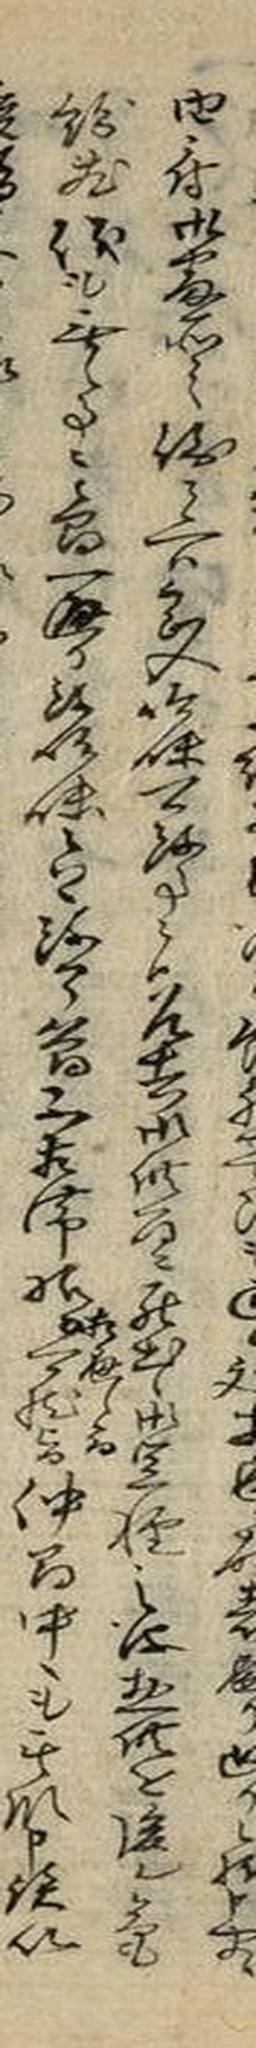紛敷儀も無之事に候間一通り致吟味候はゝ致了簡不相滞候様相通候而可然旨仲間中へも其段申談以
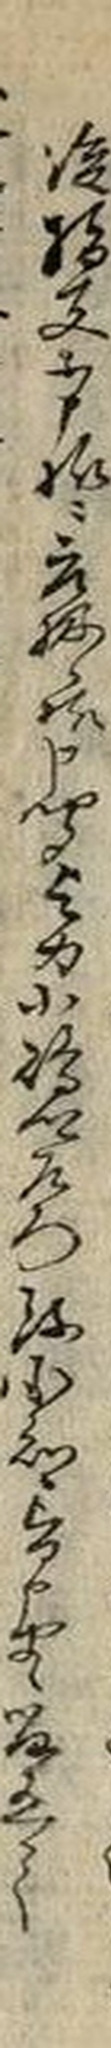後指支不申様に取扱候様申聞与力小嶋郷左衛門致承知候旨申聞候留有之
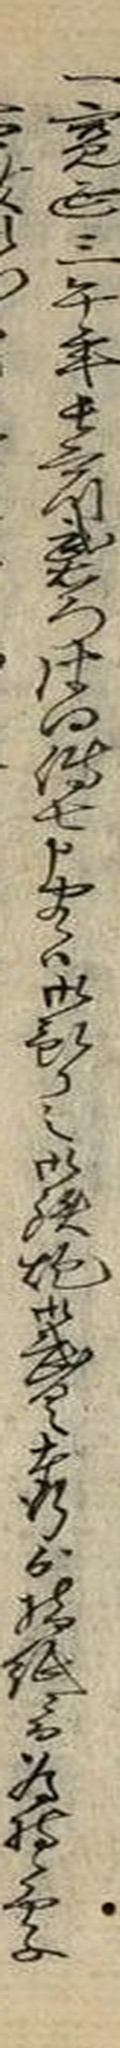一寛延三午年長谷川武右衛門津田伝七申聞候ハ御預り之御鉄炮御武具奉行ゟ指紙ニ而為持候処
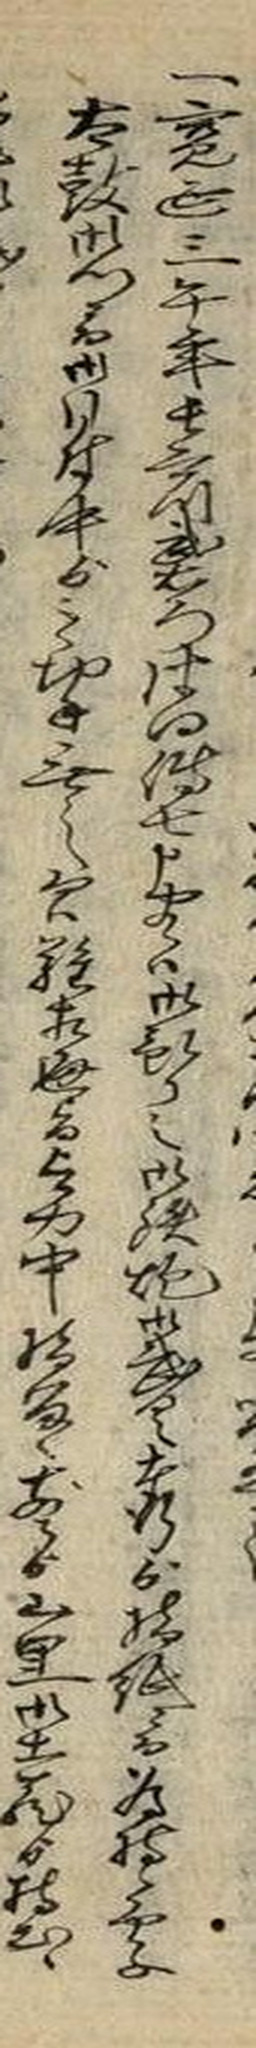太鼓御門ニ而目付中ゟ之切手無之而ハ難相通旨与力中指留候前々ゟ山里御土蔵ゟ持出候
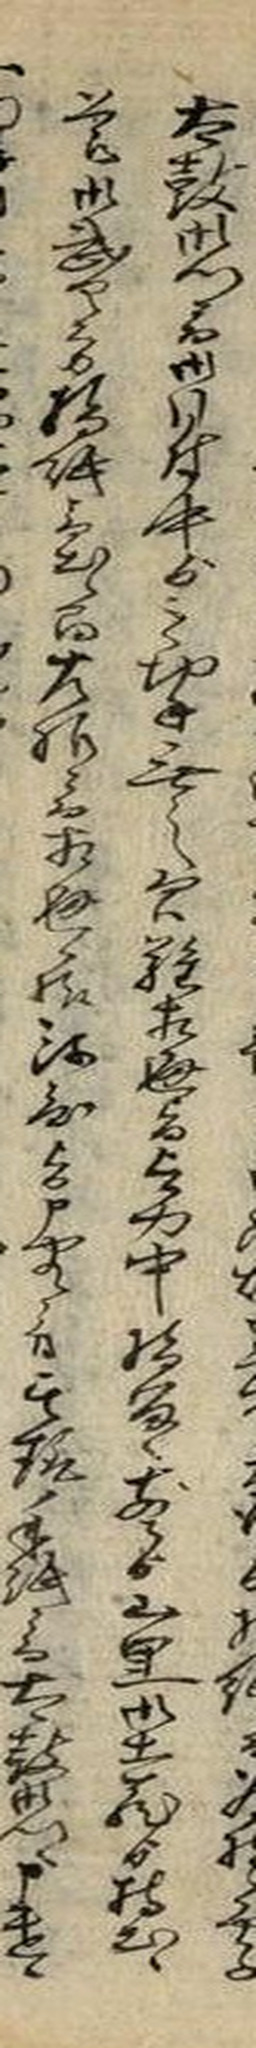節御武具方指紙ニ而出候間左様ニ而相通候様致度旨申聞候ニ付其趣手紙ニ而太鼓御門へ申遣候
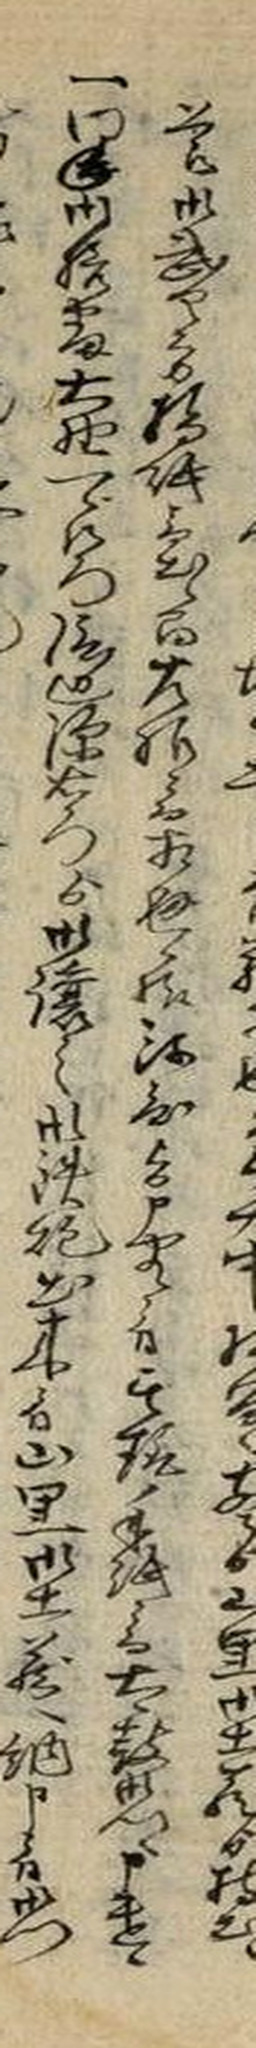一同年御膳番大野一郎左衛門渡辺源左衛門ゟ御譲之御鉄炮出来に付山里御土蔵へ納申に付御門
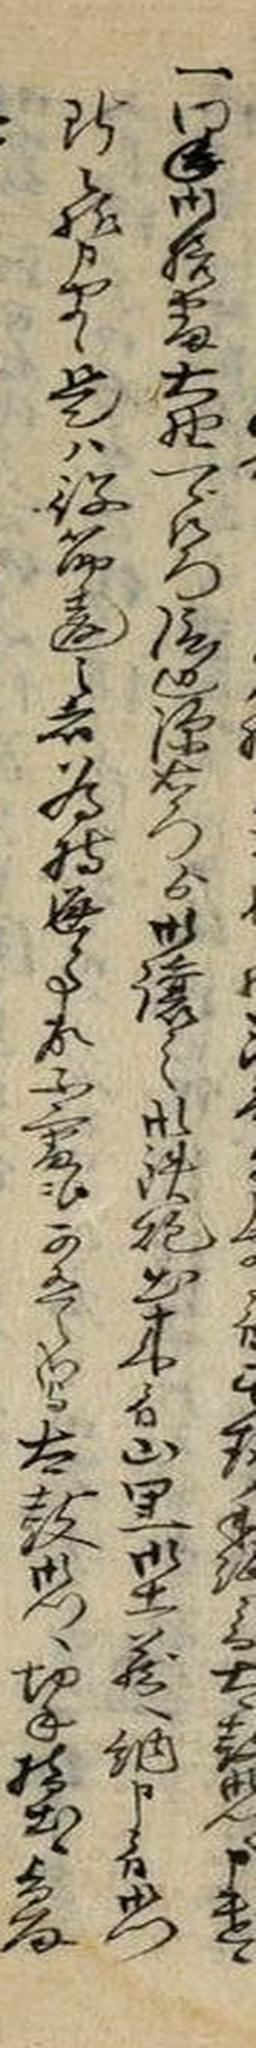断候様申聞候是は役筋違之者為持通候事故不審も可有之哉と太鼓御門へ切手指出候旨留
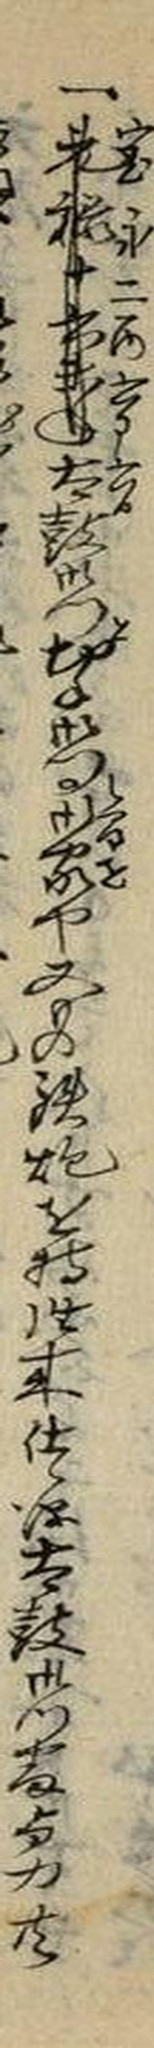一宝永二酉六月六日太鼓御門と切手御門之間を家中又もの鉄炮を持往来仕候儀太鼓御門番与力共
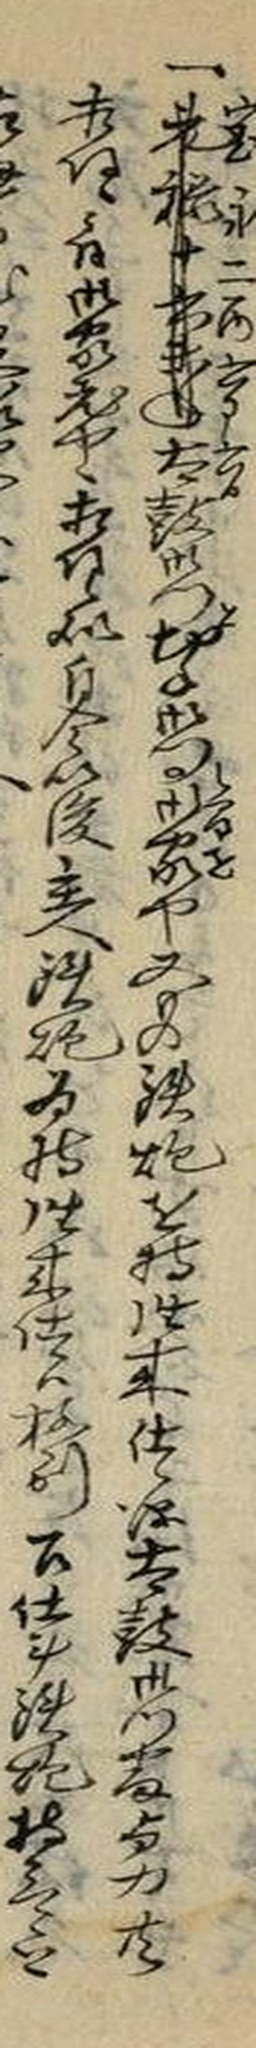相伺候に付御家老中へ相伺候処自今以後主人鉄炮為持往来仕候は格別召仕斗鉄炮持参候はゝ
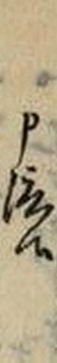申渡候
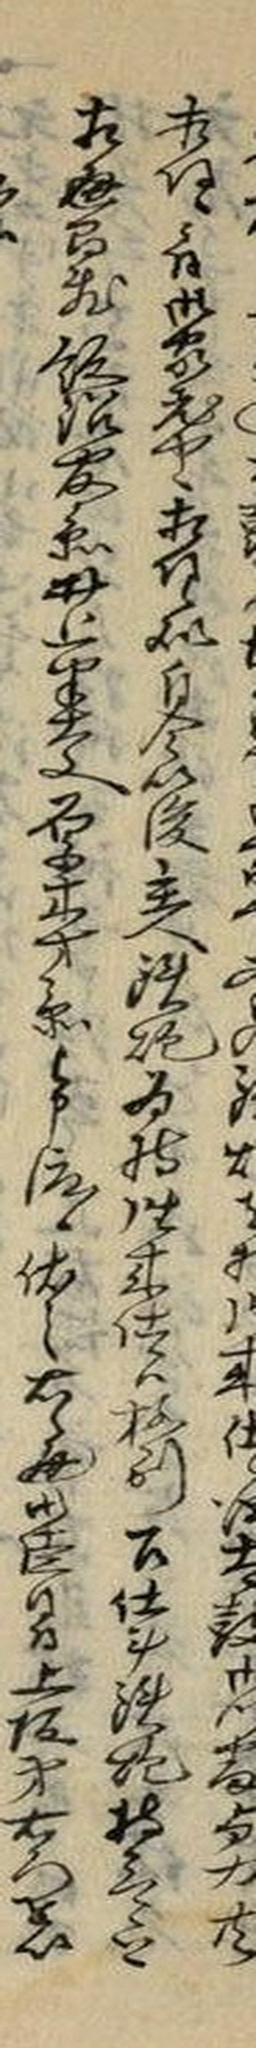相通間敷飯沼官兵衛井上半太夫厚木才兵衛へ被申渡候依之右之通御徒目付上坂第右衛門を以
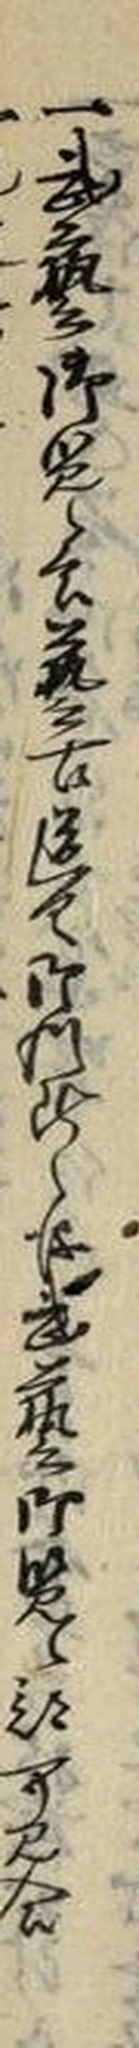一武芸御覧之節芸古道具御門断之儀武芸御覧候部可見合
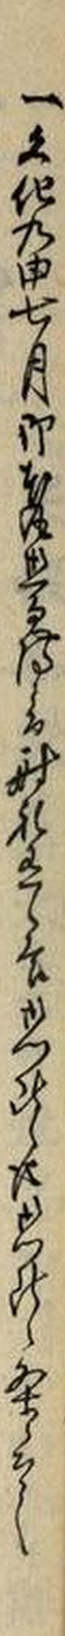一文化九申七月御本城御馬場に而射礼有之節御門断之儀御門断之条に出之
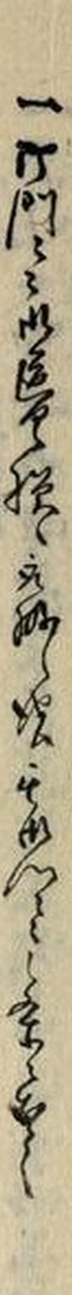一御門々々御道具損候取扱の儀其御門々々之条に出之
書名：御門御櫓之部
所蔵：福井県文書館 Fukui Prefectural Archives
